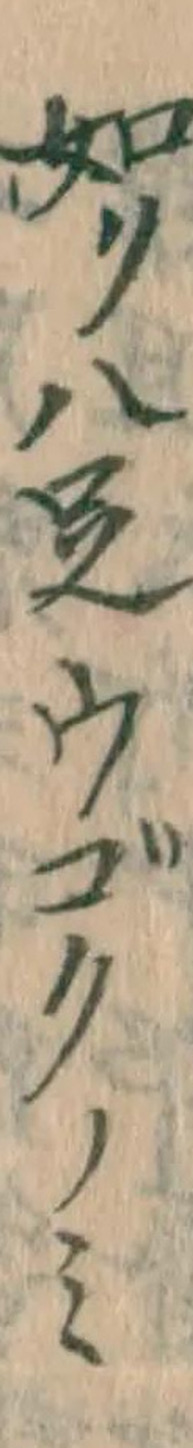如ク八足ウゴクノミ
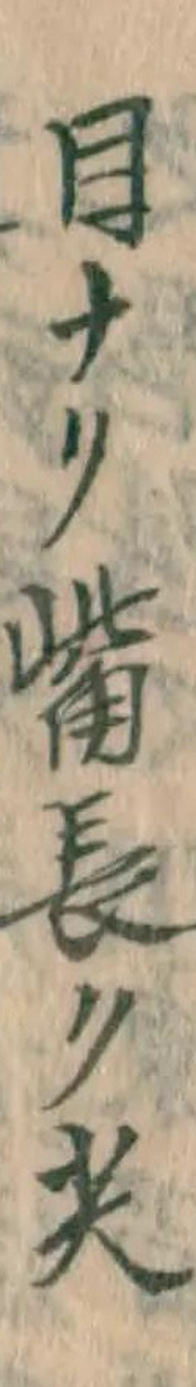目ナク觜長ク尖
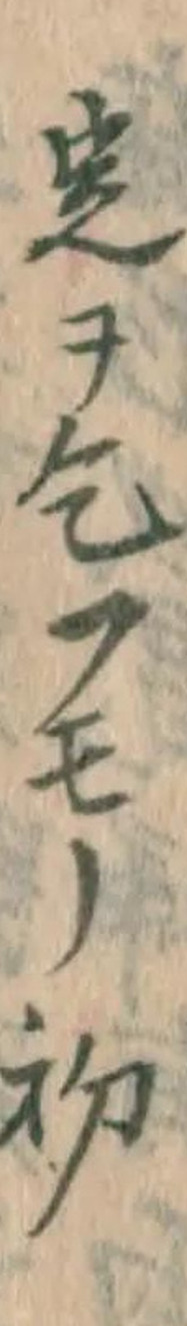定ヲ乞フモノ初
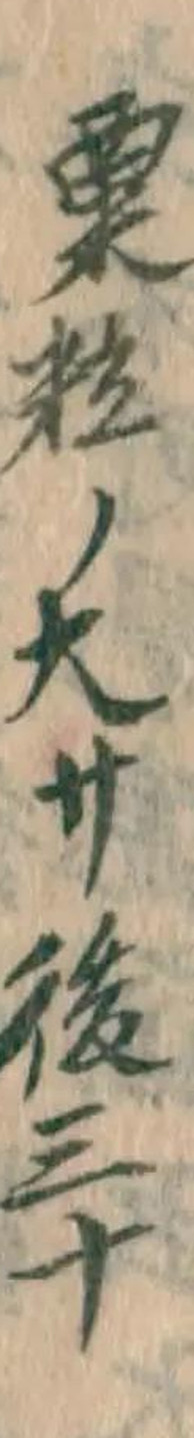粟粒ノ大サ後三十
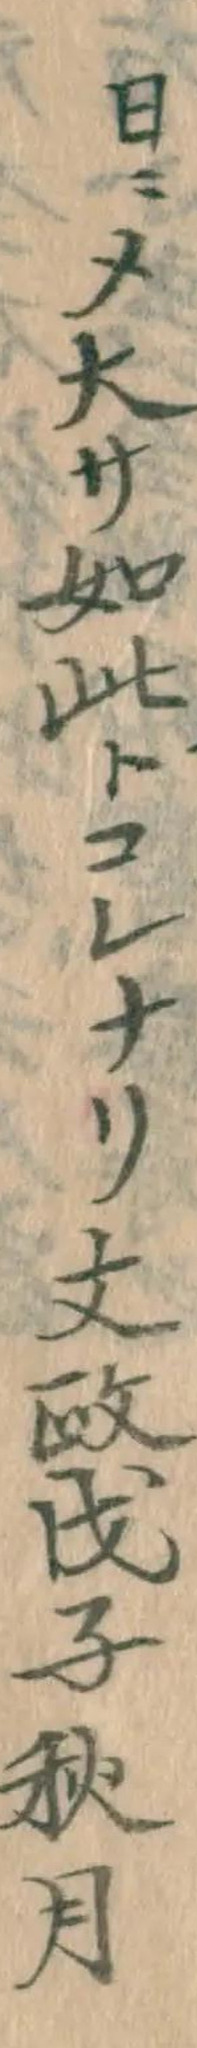日ニシテ大サ如此トコレナリ文政戊子秋月

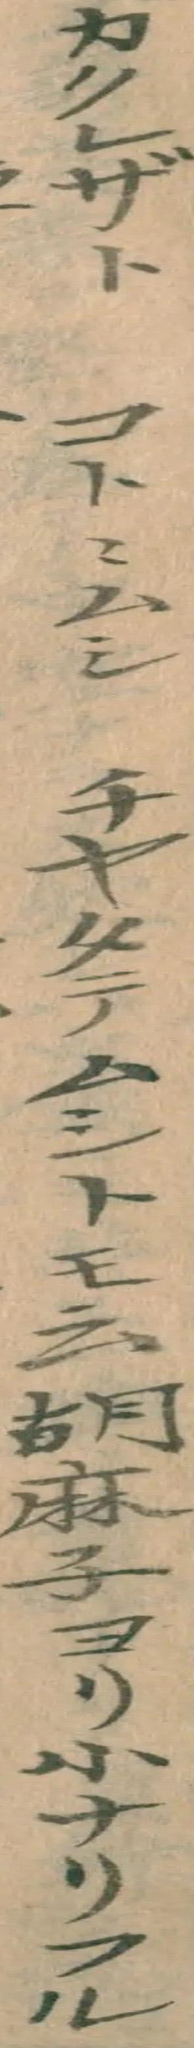カクレザトコトヽムシチヤタテムシトモ云胡麻子ヨリ小ナリフル
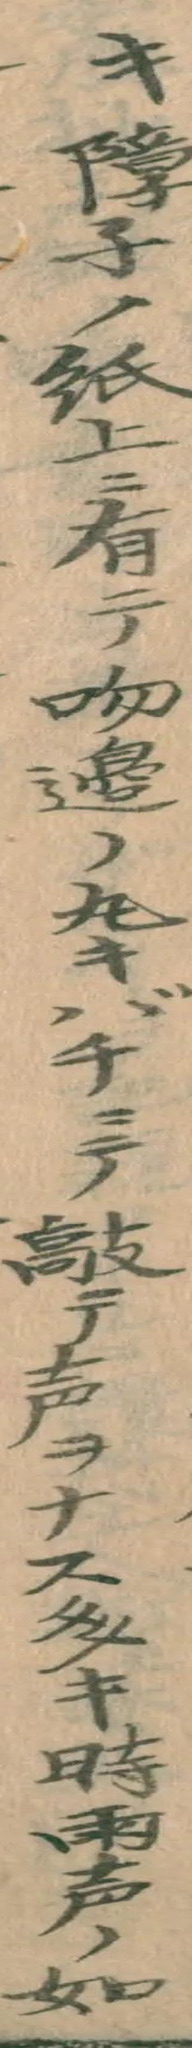キ障子ノ紙上ニ有テ吻邉ノ丸キバチニテ敲テ声ヲナス多キ時雨声ノ如
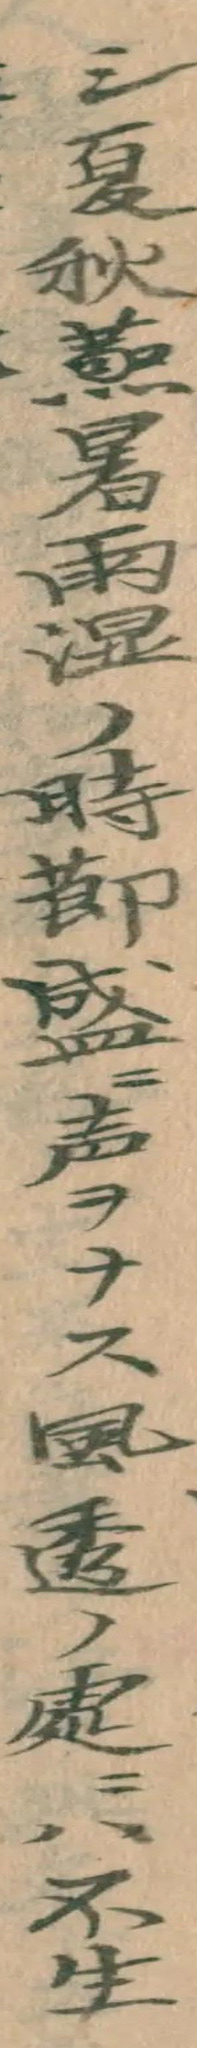シ夏秋蒸暑雨湿ノ時節盛ニ声ヲナス風透ノ處ニハ不生
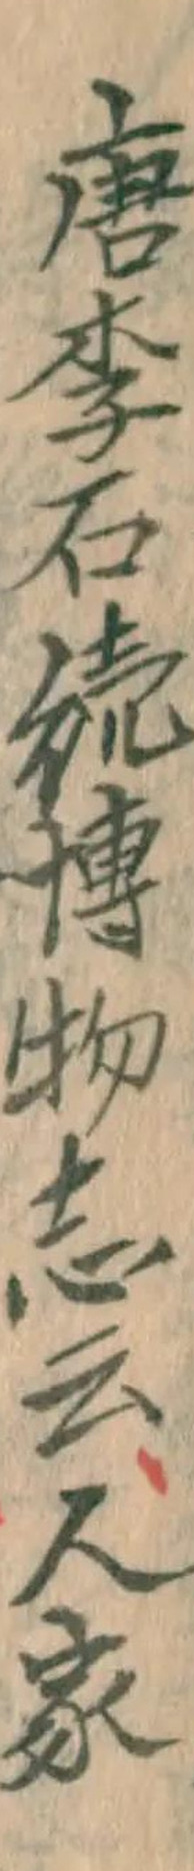唐李石続博物志云、人家
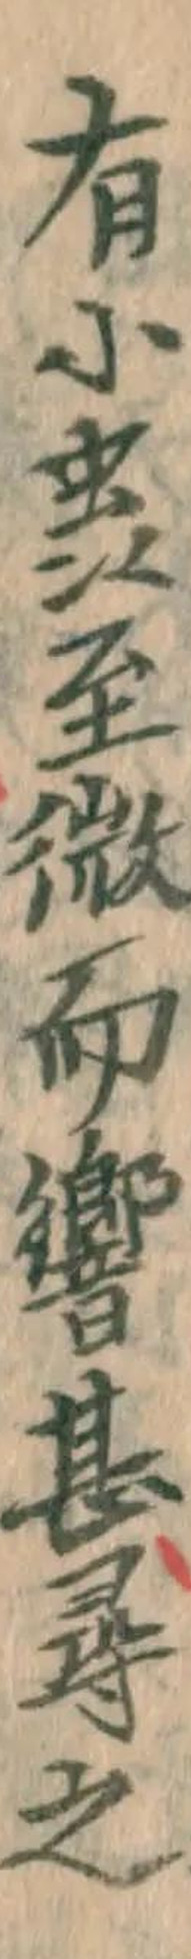有小蟲至微而響甚、尋之
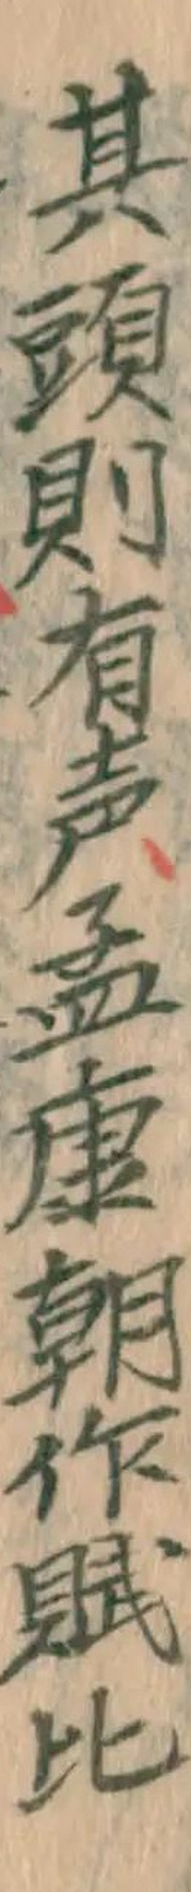其頭則有声、孟康朝作賦比
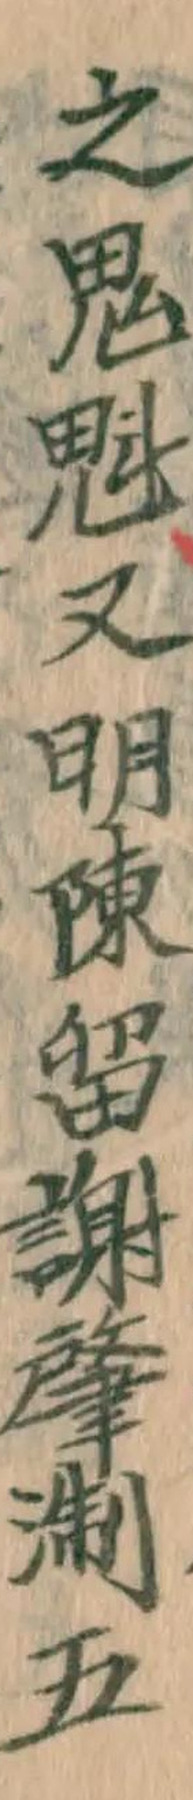之鬼魁、又明陳留謝肇淛五
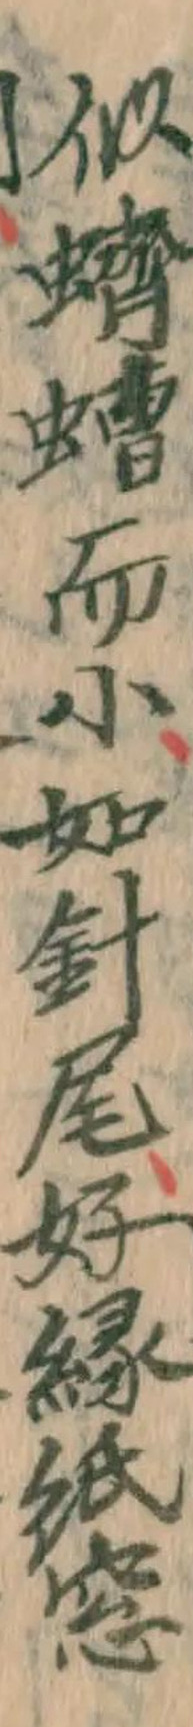似蠐螬而小、如針尾、好縁紙窓
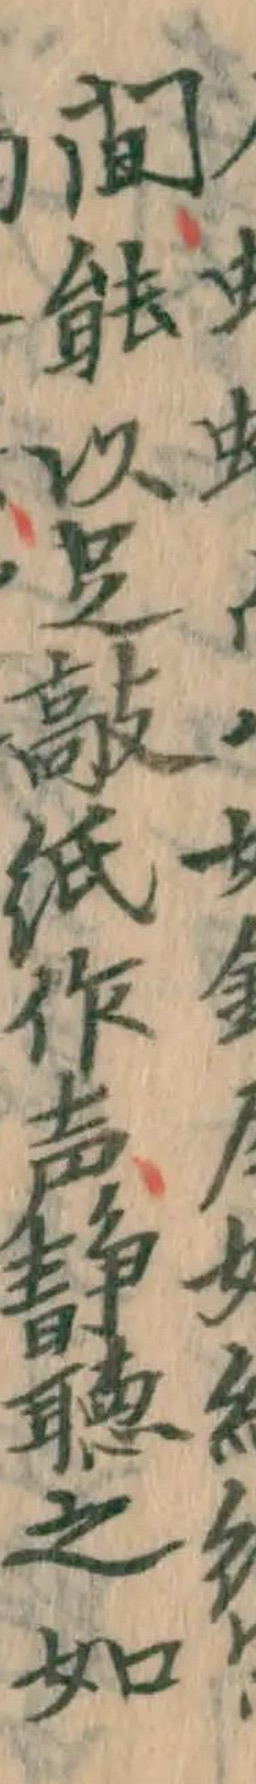間、能以足敲紙作声、静聴之如

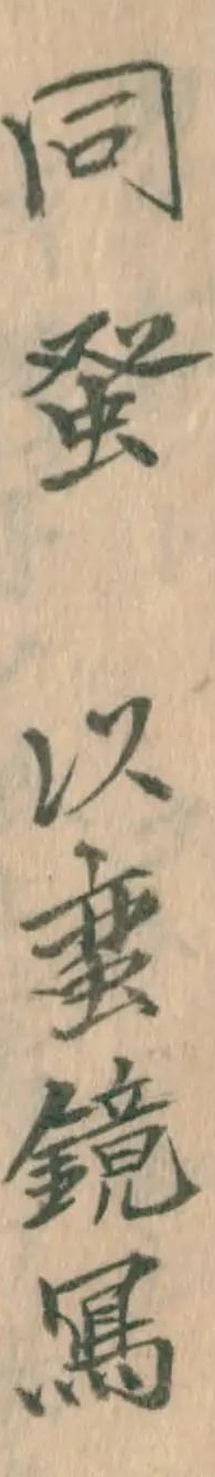同蚤以蛮鏡寫

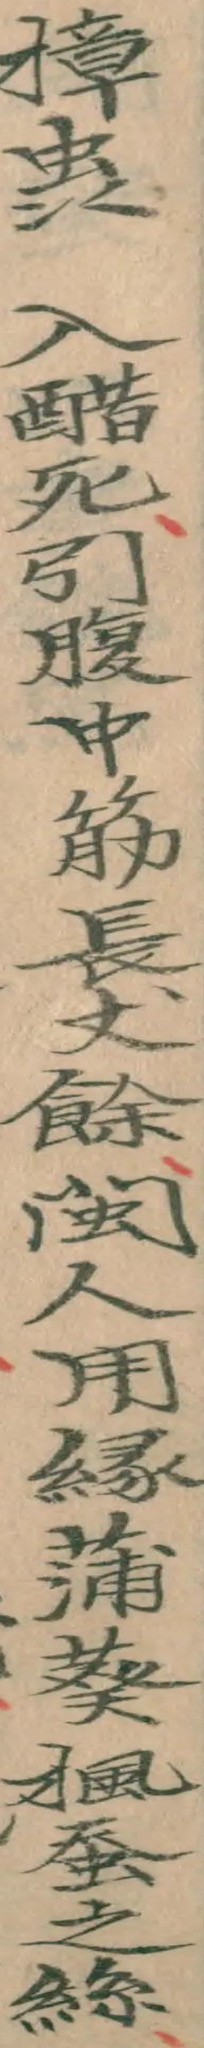樟蟲入醋死、引腹中筋長𠀋餘、閩人用縁蒲葵楓蚕之絲、
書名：千蟲譜 3巻. [1]
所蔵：国立国会図書館 National Diet Library, JAPAN
